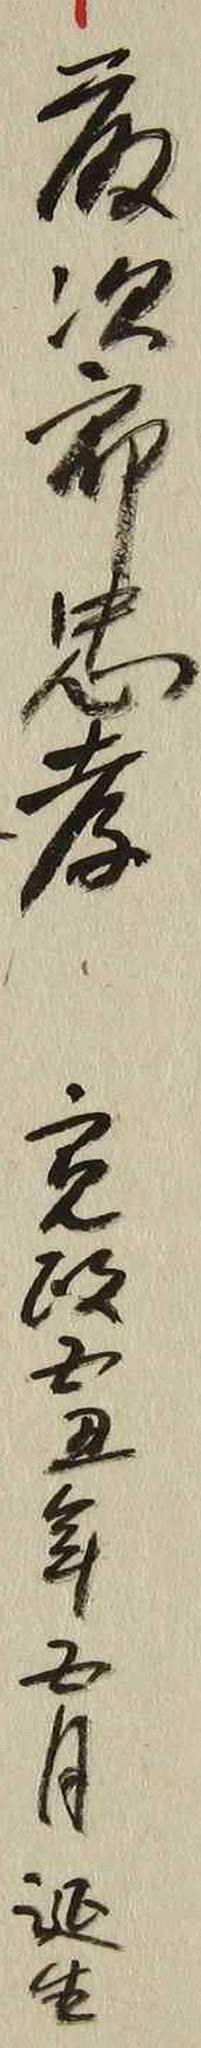藤次郎忠孝寛政五丑年五月誕生
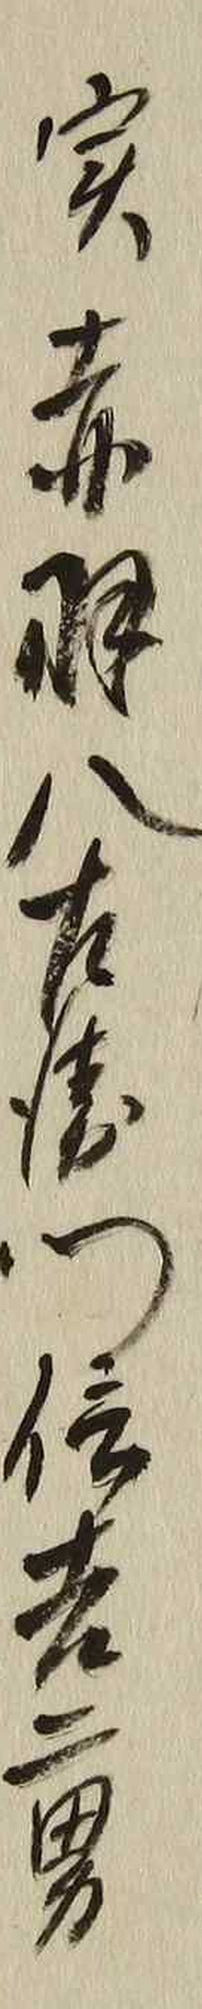実赤羽八左衛門信吉二男
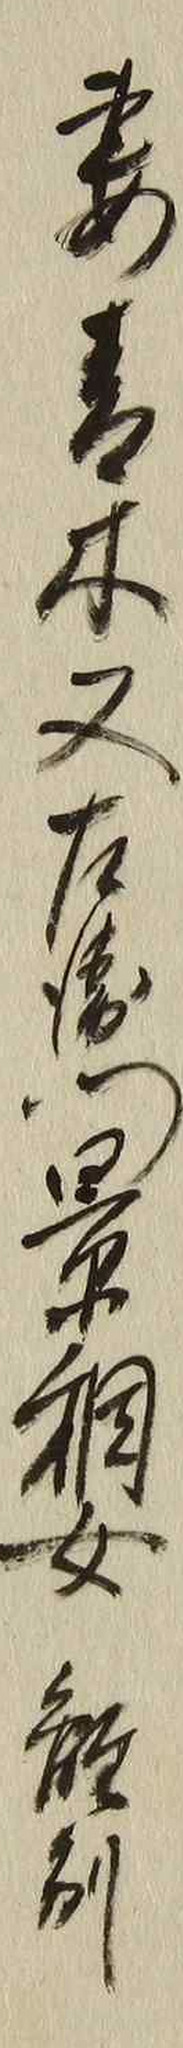妻青木又左衛門景稠女離別
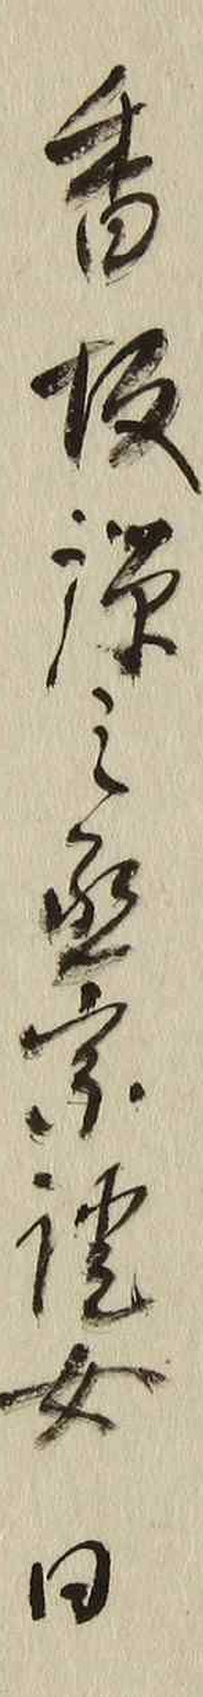香坂弾之丞宗証女同
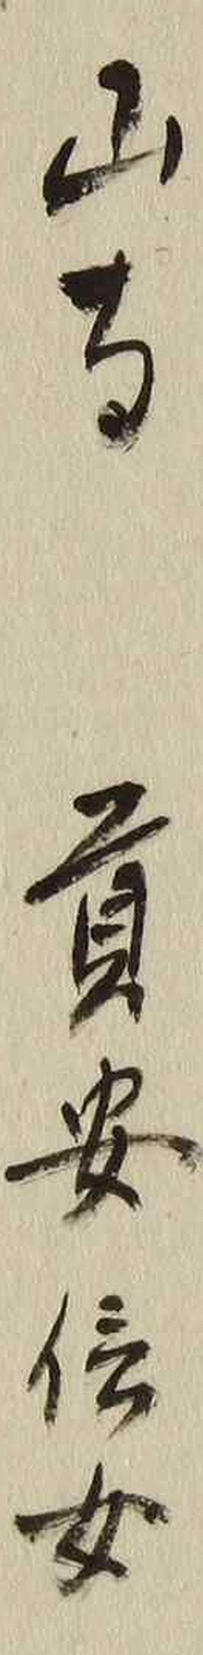山寺貢安信女
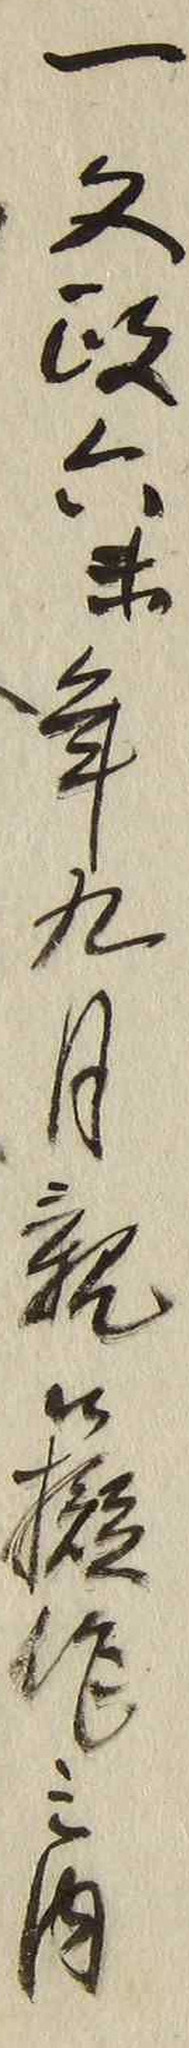一文政六未年九月親御擬作之内
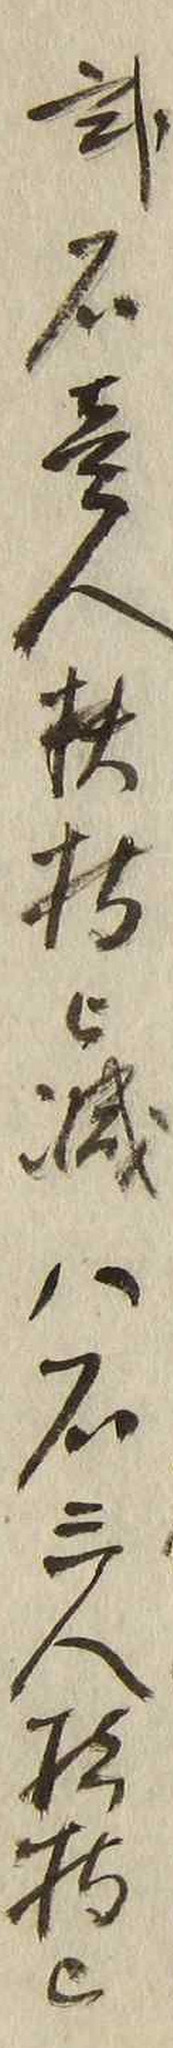弐石壱人扶持被減八石三人扶持被

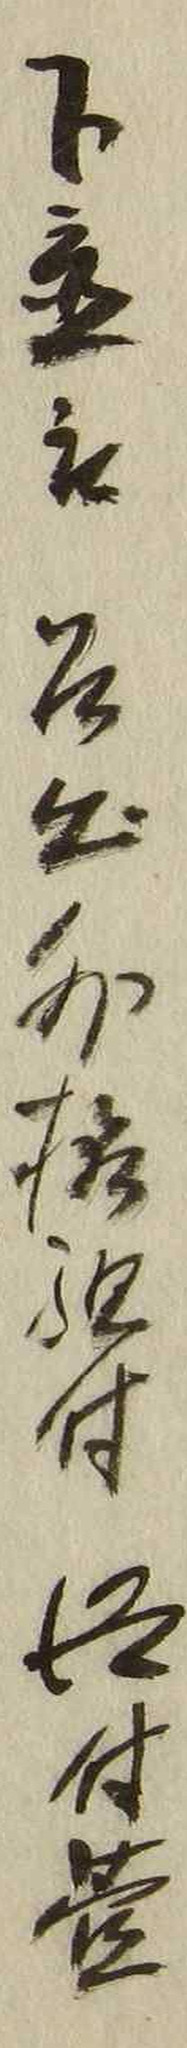下置被召出外様組付仰付萱
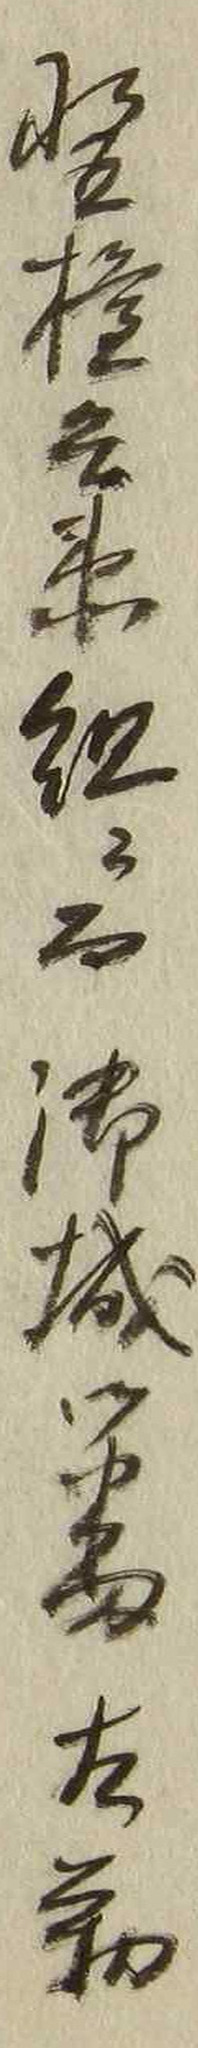野権兵衛組ニ而御城御番相勤

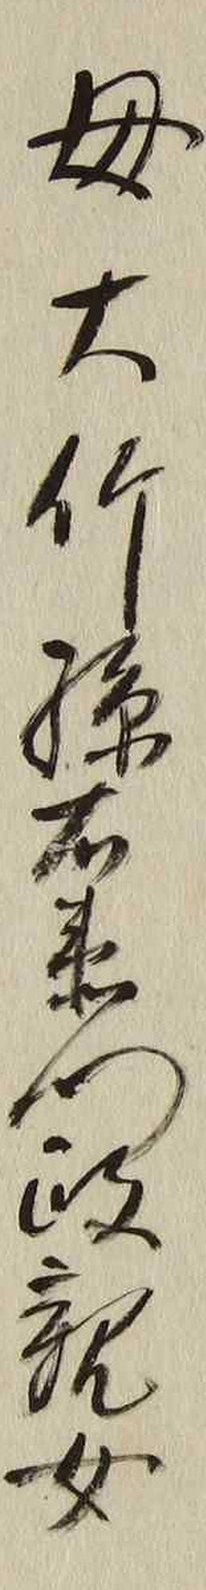母大竹孫右衛門政親女
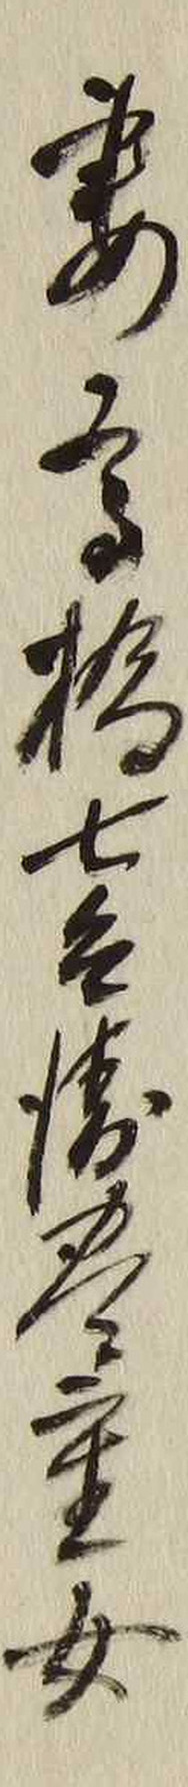妻高橋七兵衛豊重女
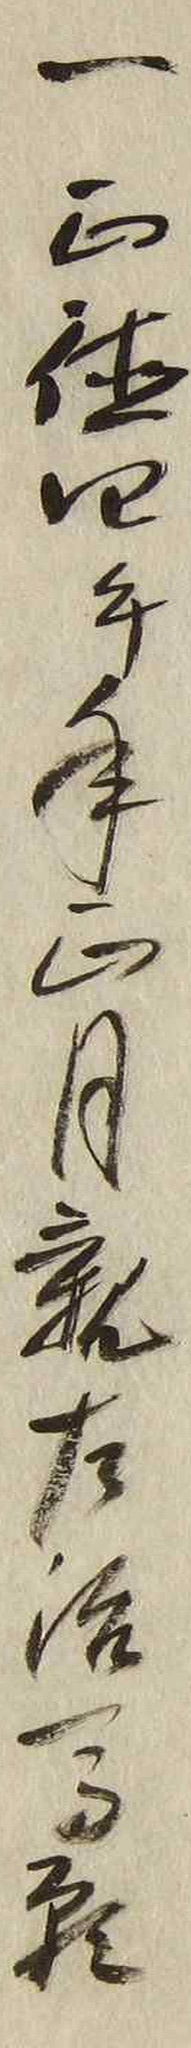一正徳四午年正月親左治馬願

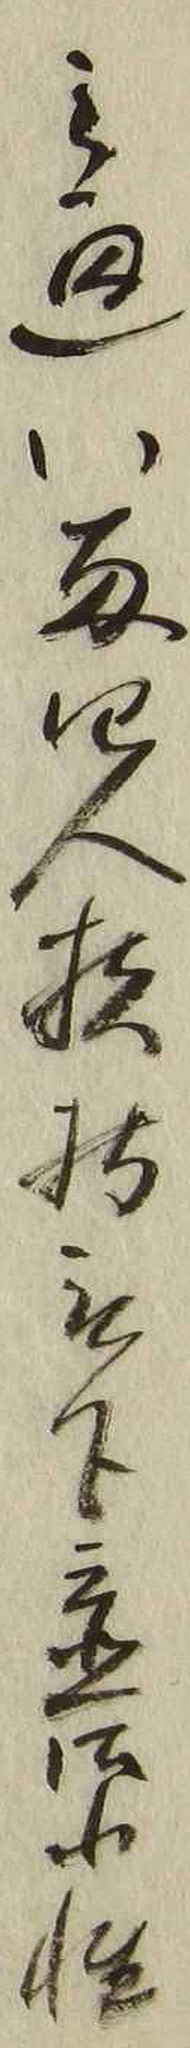之通八両四人扶持被下置御小性
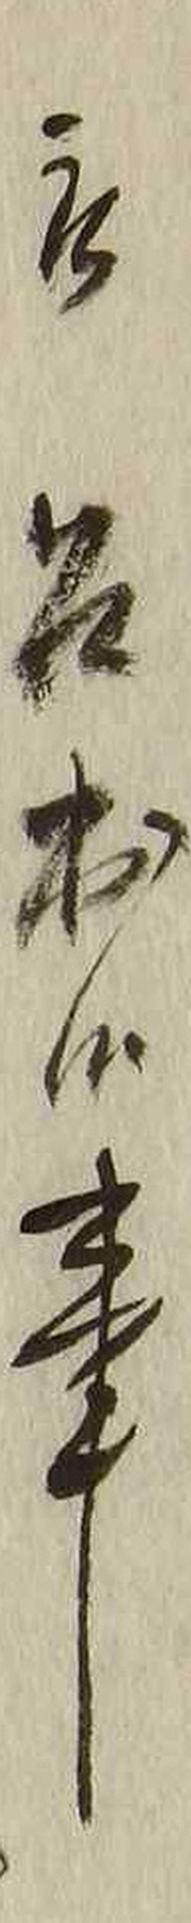被召出候事
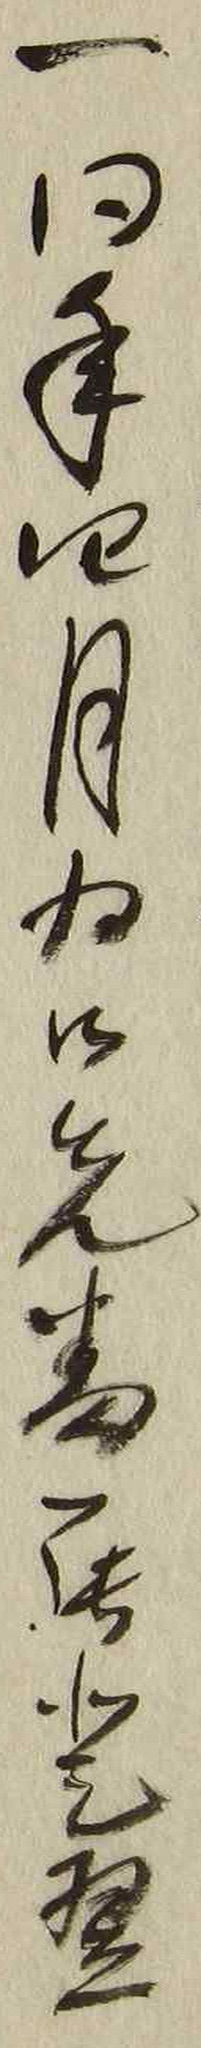一同年四月為御先番罷登翌
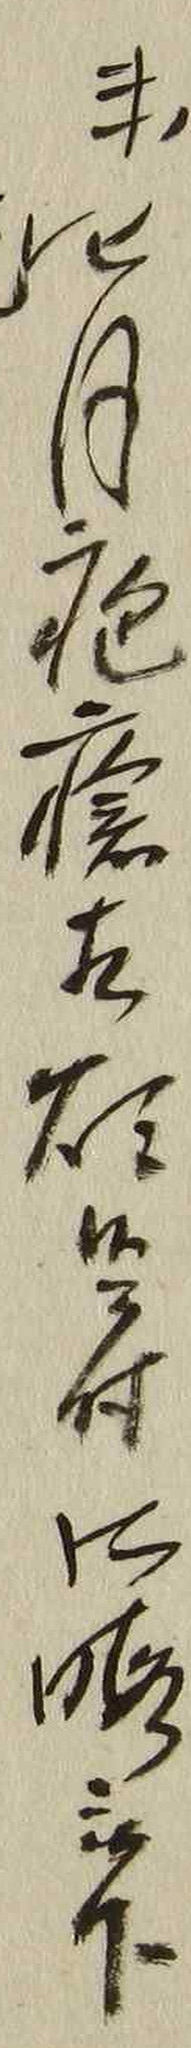未四月疱瘡相煩候ニ付御暇被下
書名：諸士系譜　巻之359　す之部9
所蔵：会津若松市立会津図書館
